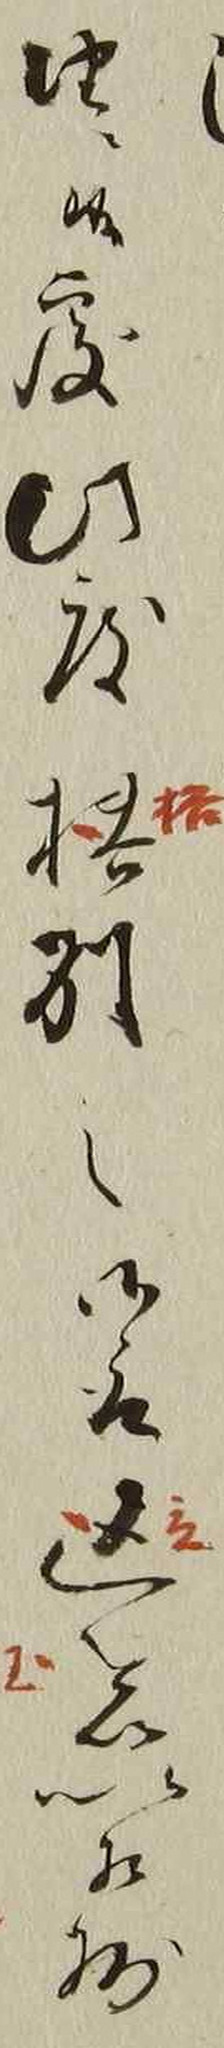由ニ候処此度格別之御取立者以相州
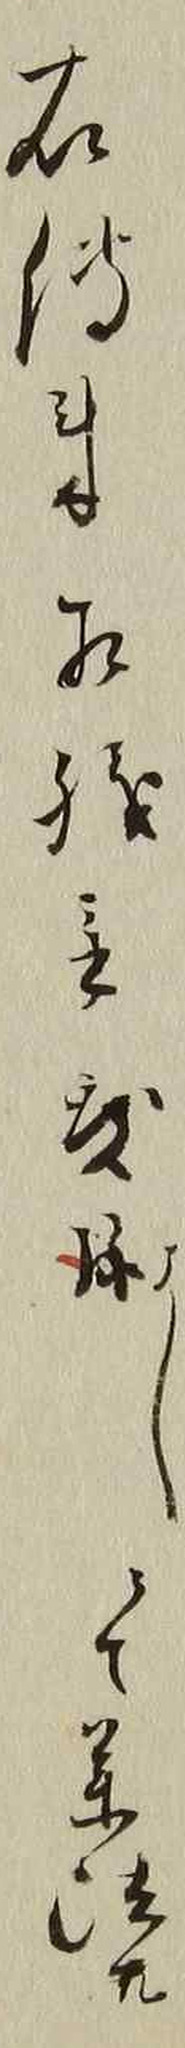右伝来相残置度よしニて薬法共
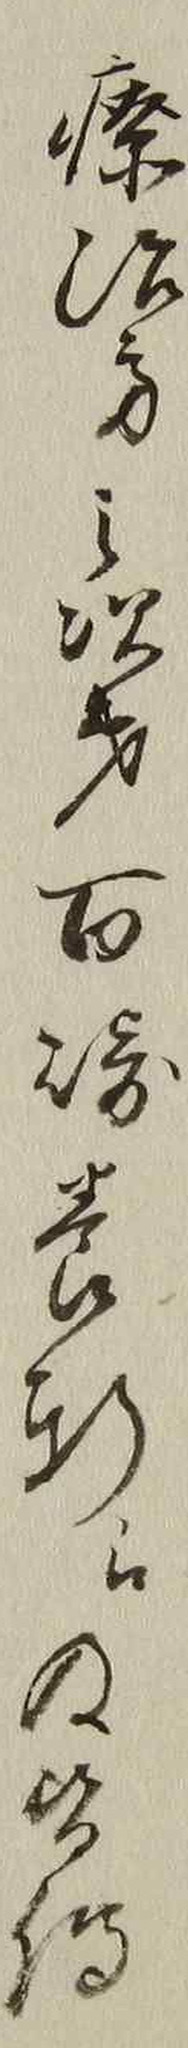療治方之次第百崎養軒江及皆伝
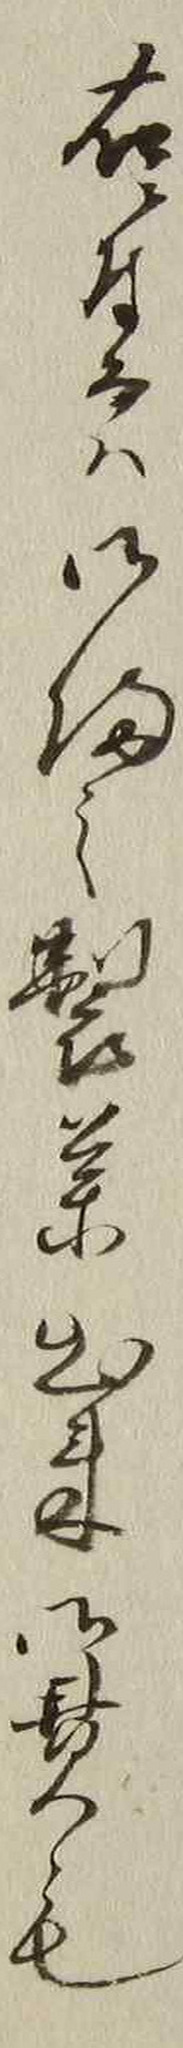右ニ付而ハ御備之製薬出来御費も
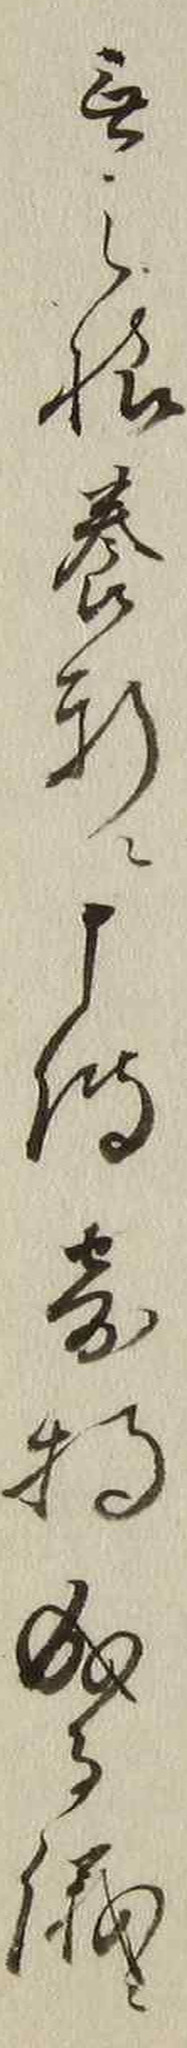無之様養軒ニ申伝奇特成る儀ニ
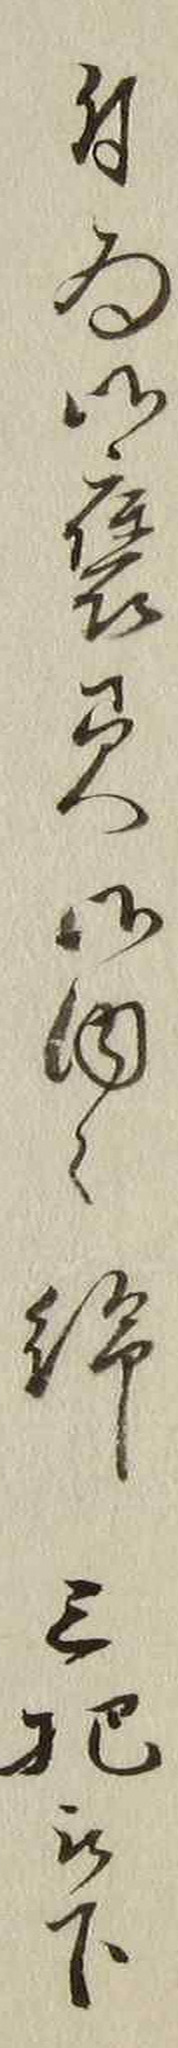付為御褒美御内々綿三把被下
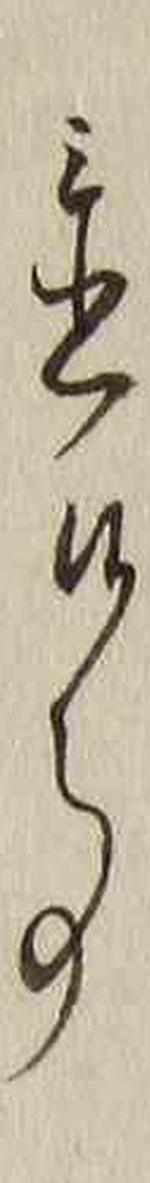置候事
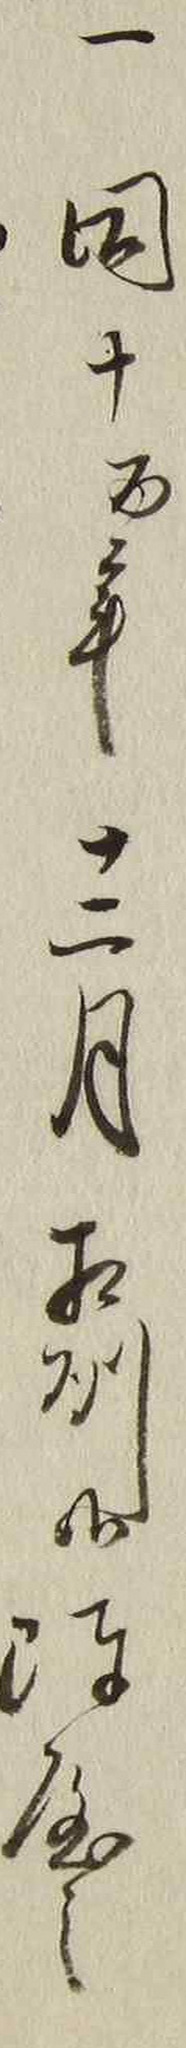一同十酉年十二月相州御陣屋之
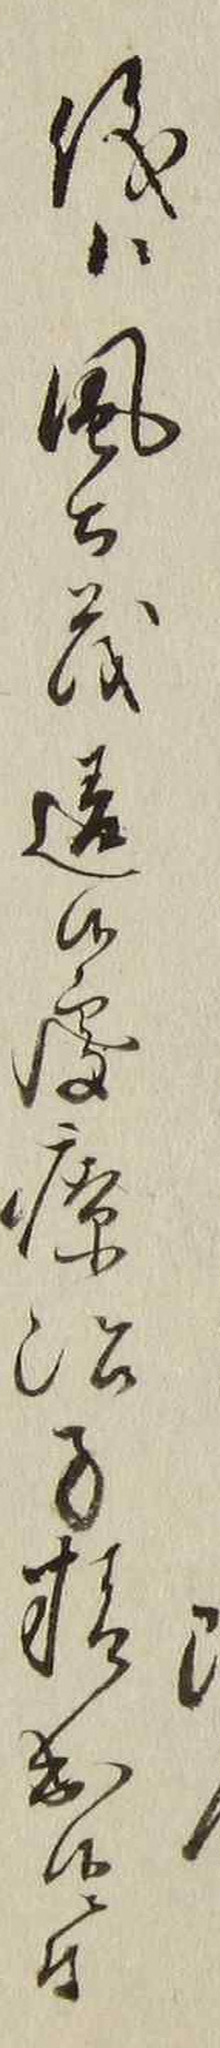儀ハ風土も違候処療治方精出候ニ付
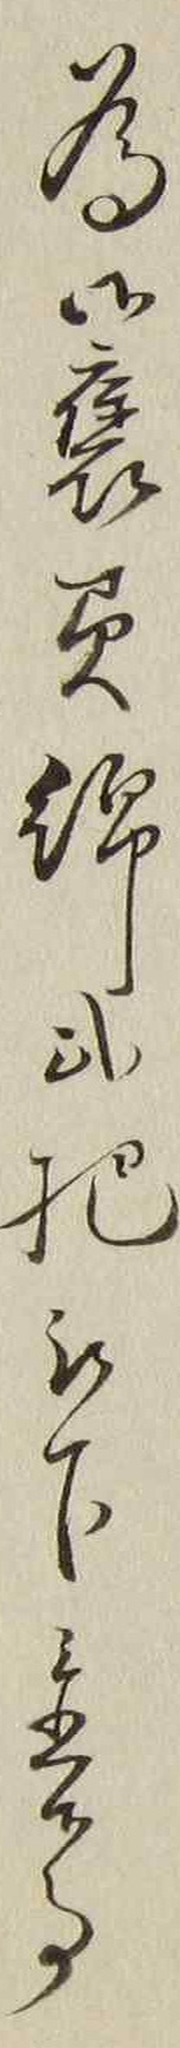為御褒美綿弐把被下置候事
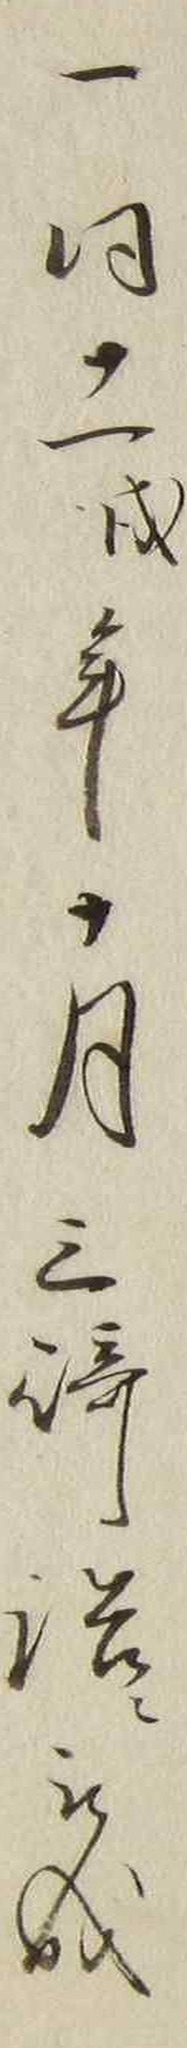一同十一戌年十月三崎詰ニ被成

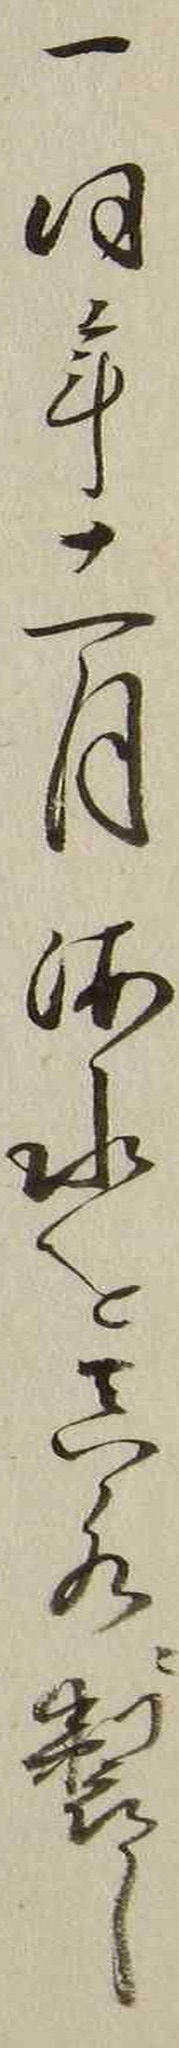一同年十一月海水を真水ニ製し
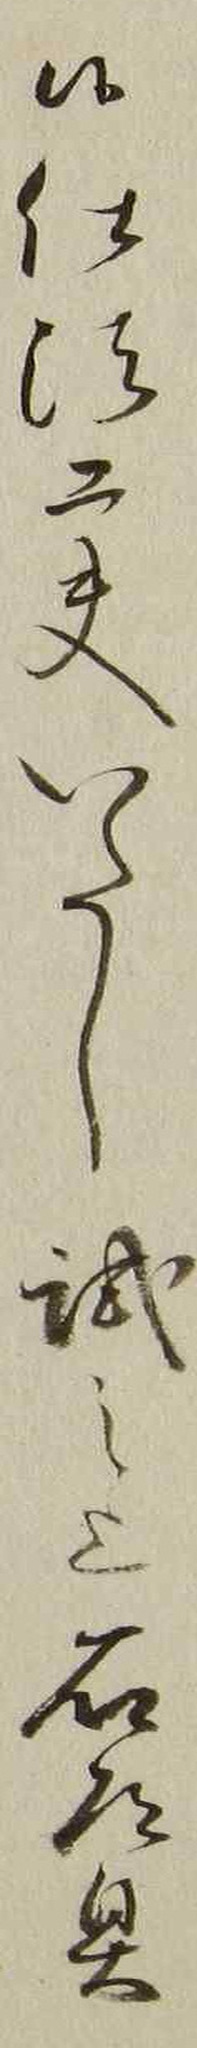候仕法工夫いたし試之上石道具
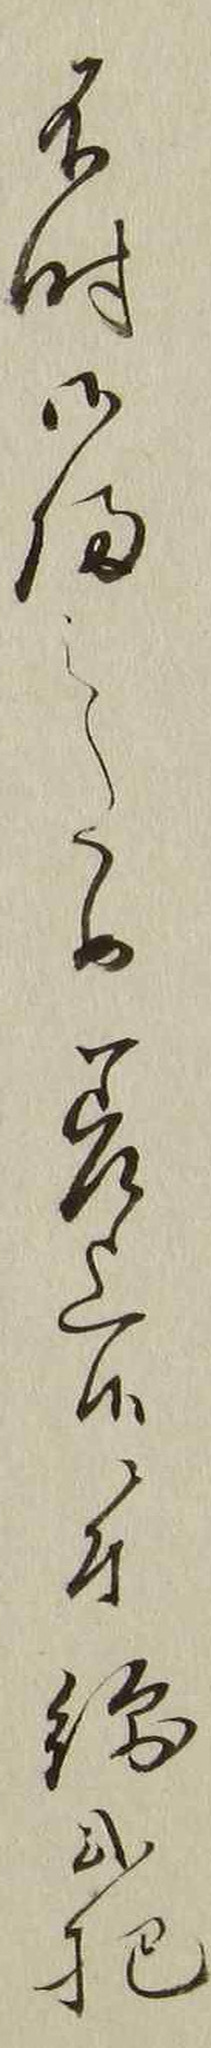不時御帰之ため差上候ニ付綿弐把
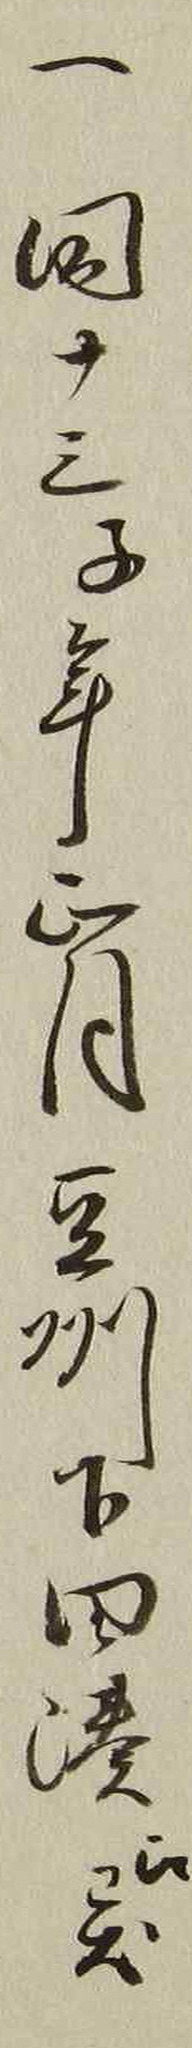一同十三子年正月豆州下田湊江異
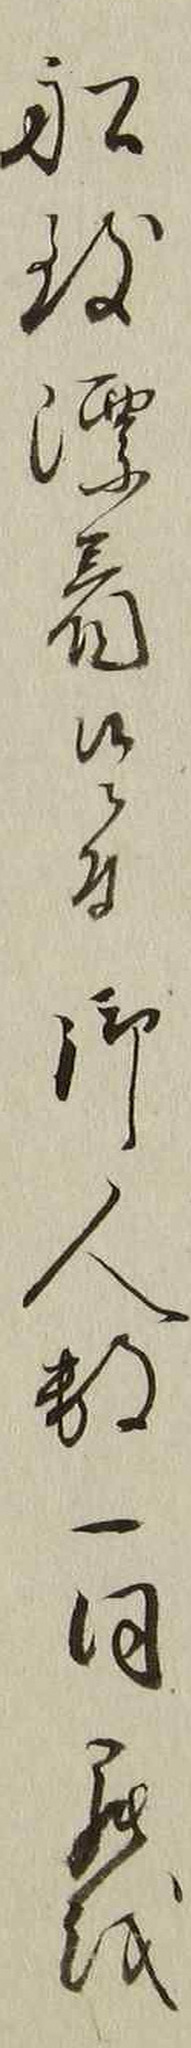船致漂着候ニ付御人数一同罷越
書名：諸士系譜　巻之129　た之部5
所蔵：会津若松市立会津図書館
